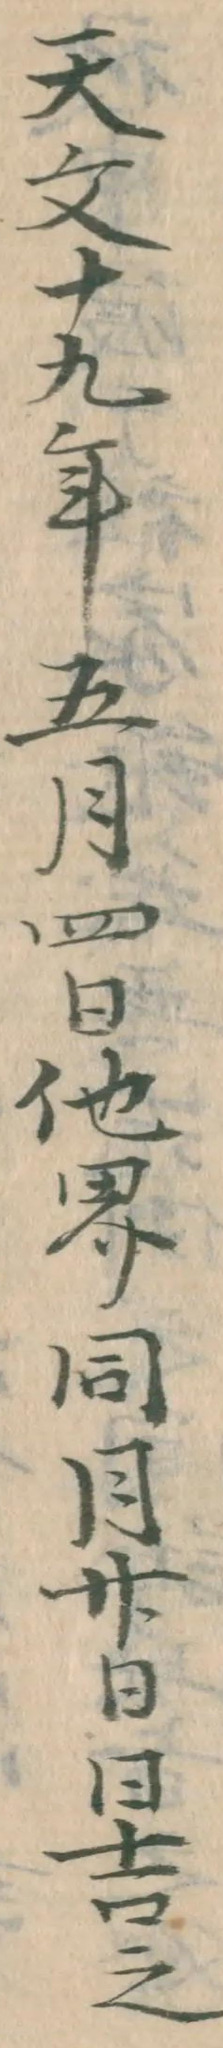天文十九年五月四日他界同月廿日日吉之
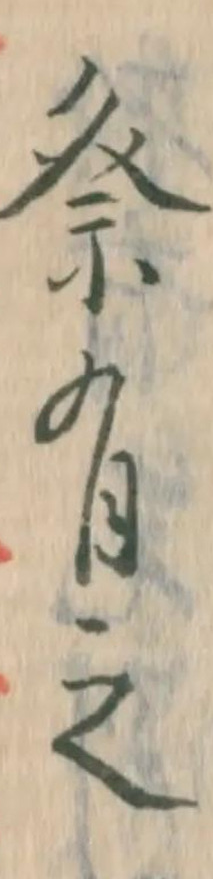祭有之
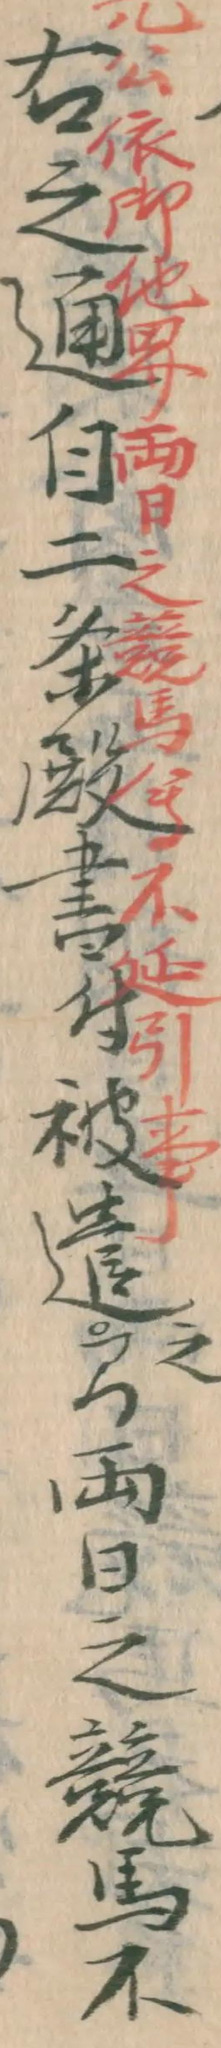右之通自二条殿書付被遣￮間両日之競馬不
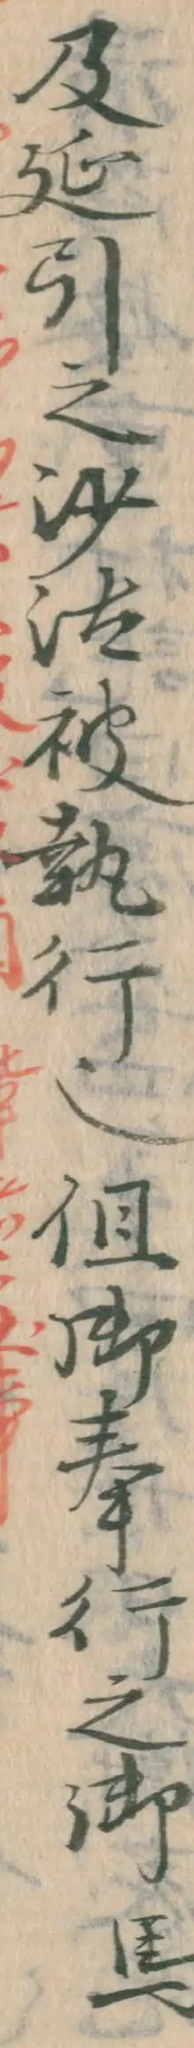及延引之沙汰被執行也但御奉行之御馬
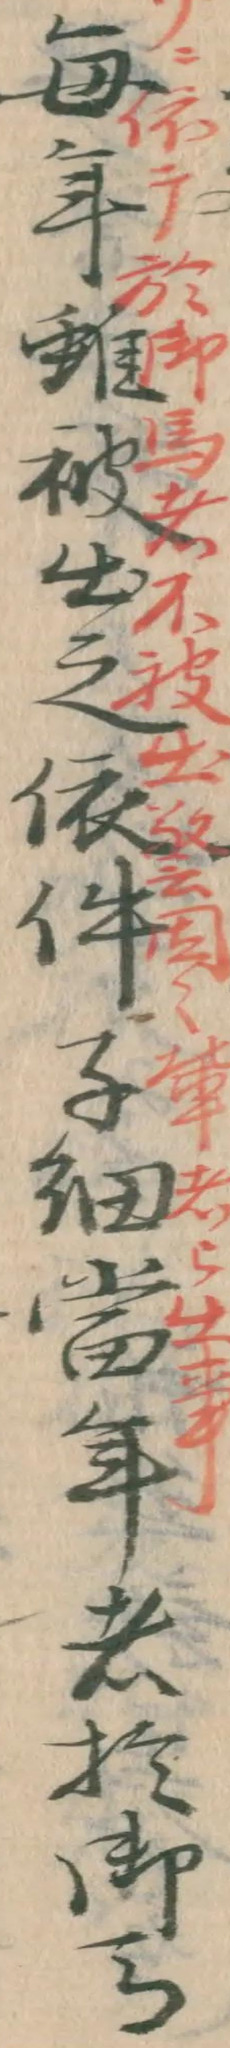毎年雖被出之依件子細当年者於御馬
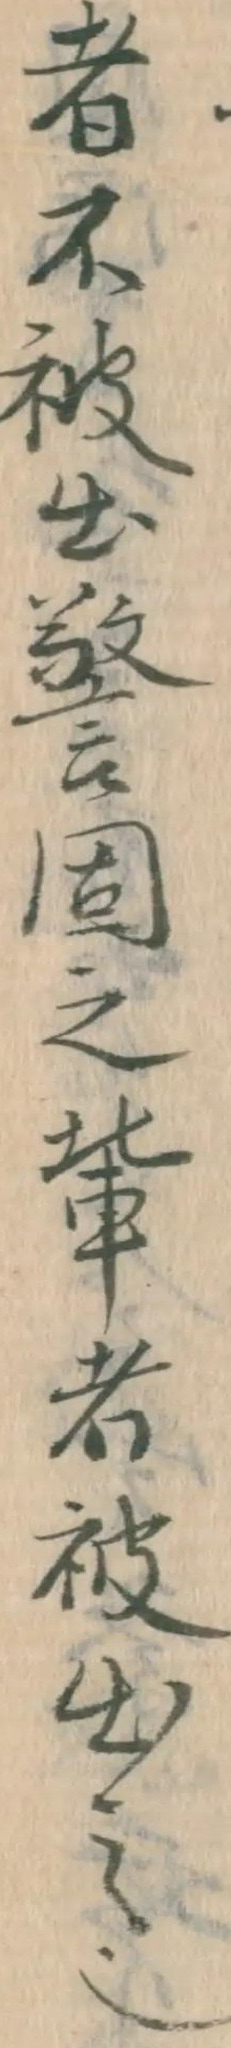者不被出警固之輩者被出之也
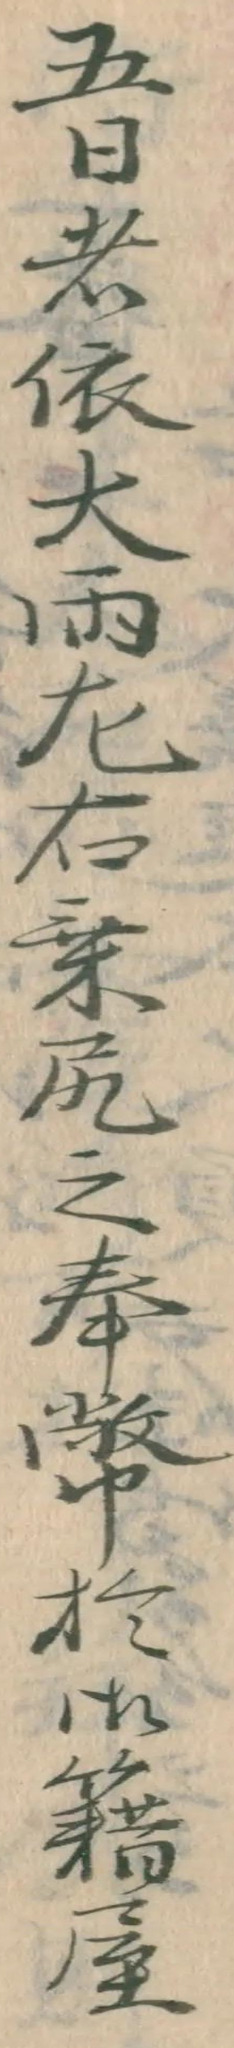五日者依大雨左右乗尻之奉幣於御籍屋
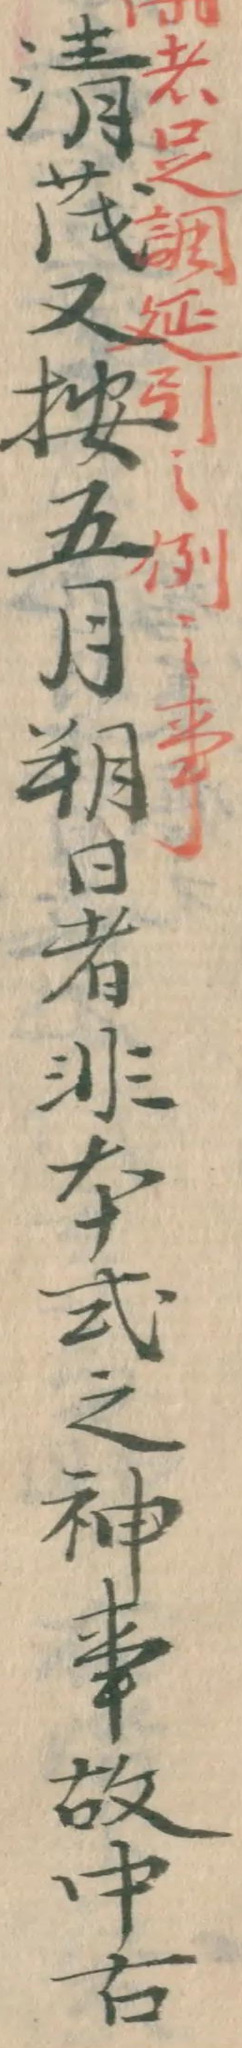清茂又按五月朔日者非本式之神事故中古
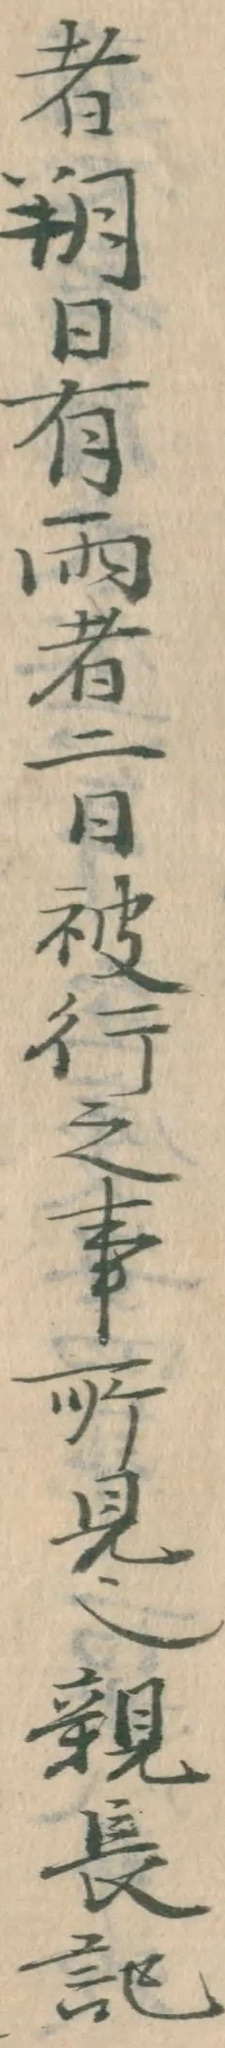者朔日有雨者二日被行之事所見也親長記
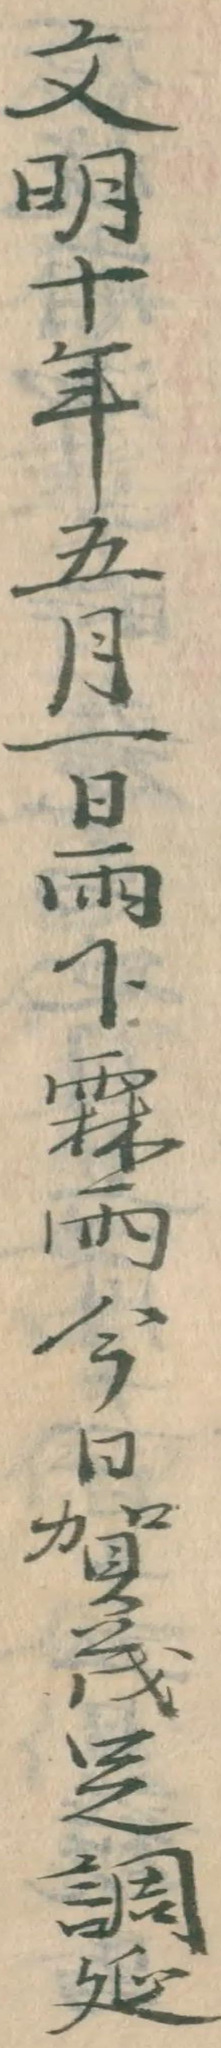文明十年五月一日雨下霖雨今日賀茂是調延
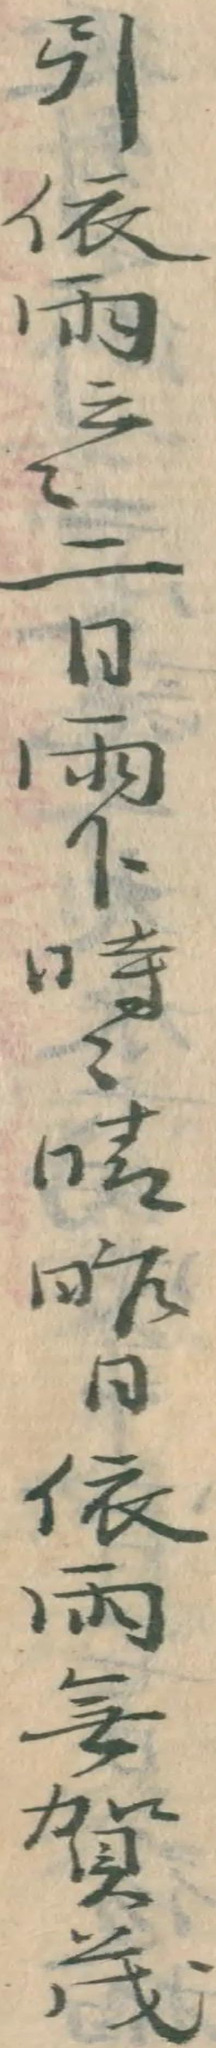引依雨云々二日雨下時々晴昨日依雨無賀茂
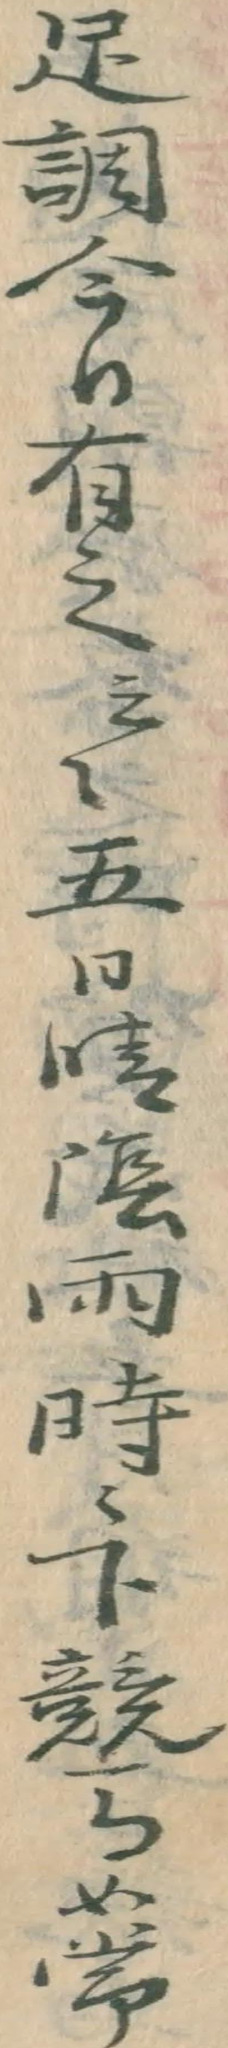足調今日有之云々五日晴陰雨時々下競馬如常

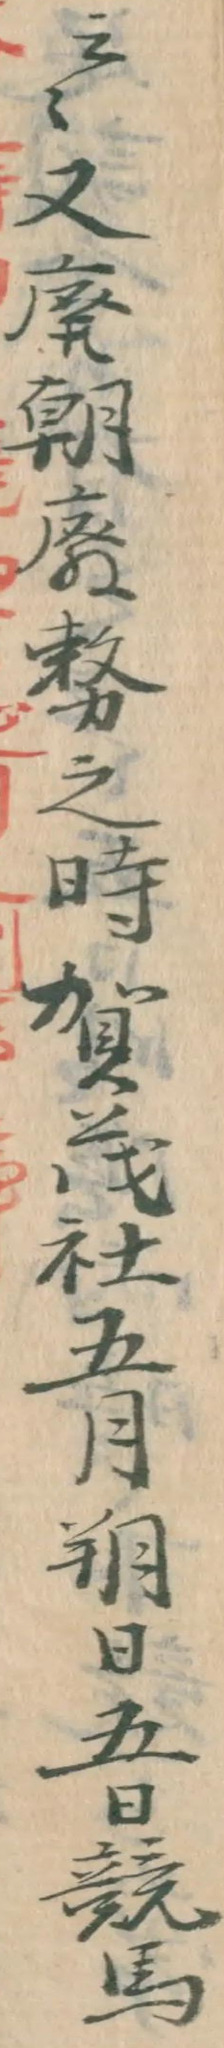云々又廃朝廃務之時賀茂社五月朔日五日競馬
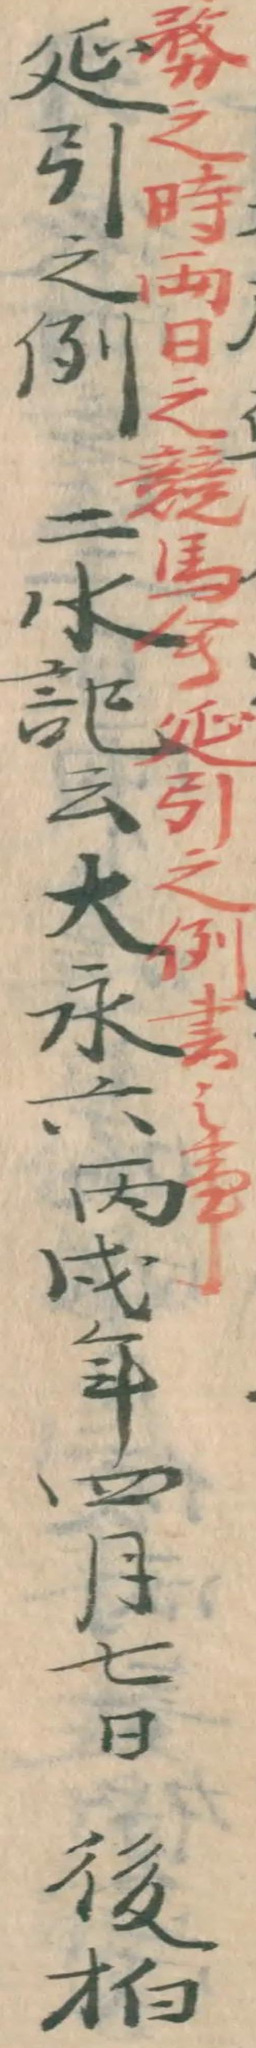延引之例二水記云大永六丙戌年四月七日後柏
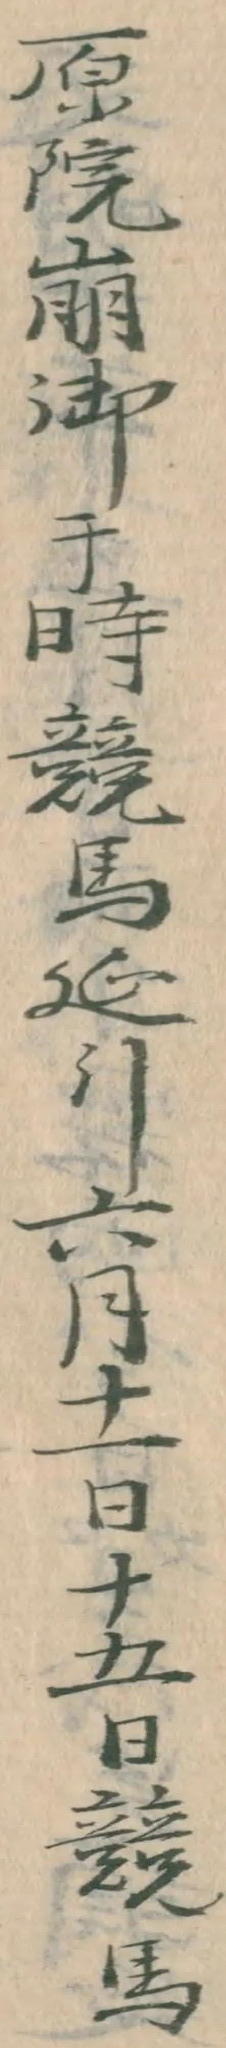原院崩御于時競馬延引六月十一日十五日競馬
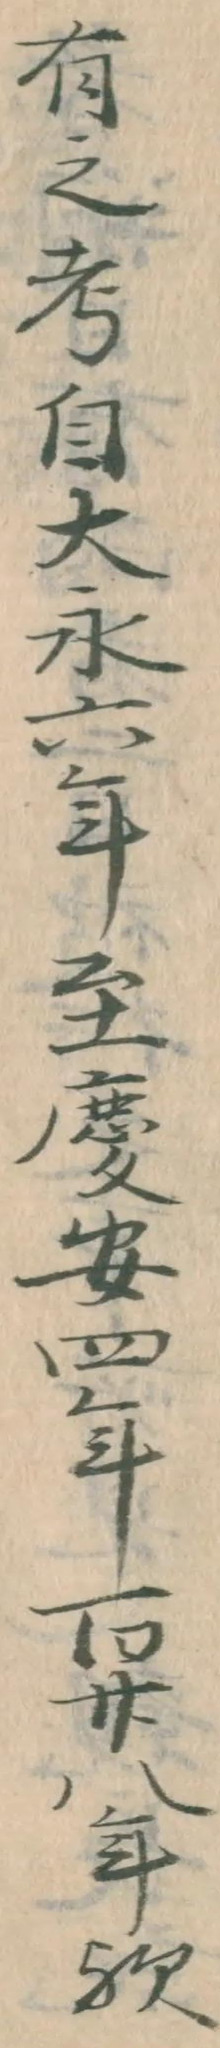有之考自大永六年至慶安四年百廿八年歟
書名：賀茂社記録. 第10冊
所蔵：国立国会図書館 National Diet Library, JAPAN
